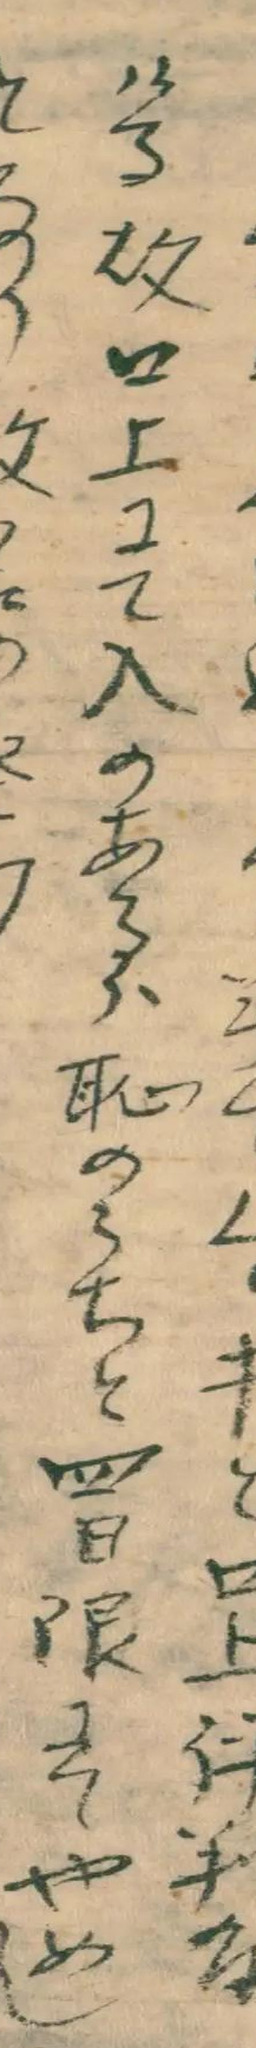ける故口上にて入のあるは恥のうちと四日限にてやめし
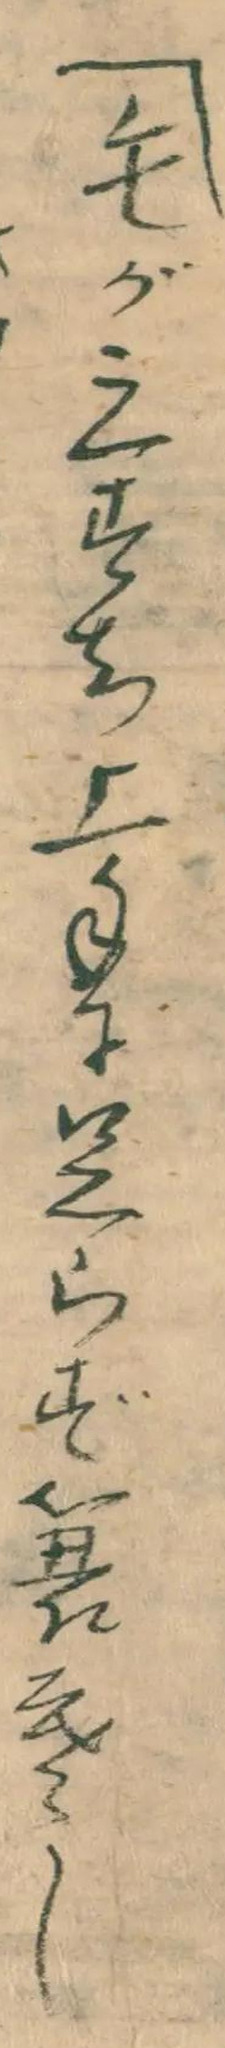〽毛が三すち上手に足らず蓑寒し
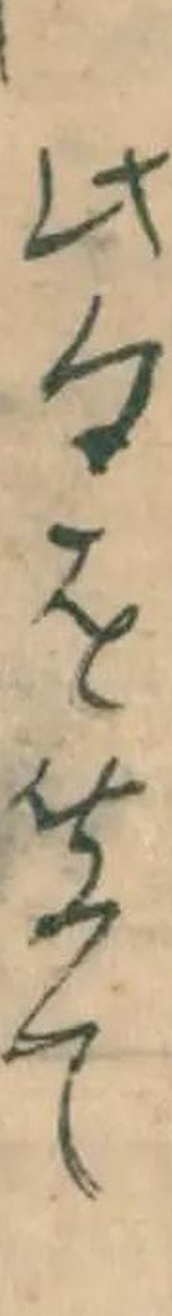此句を聞て
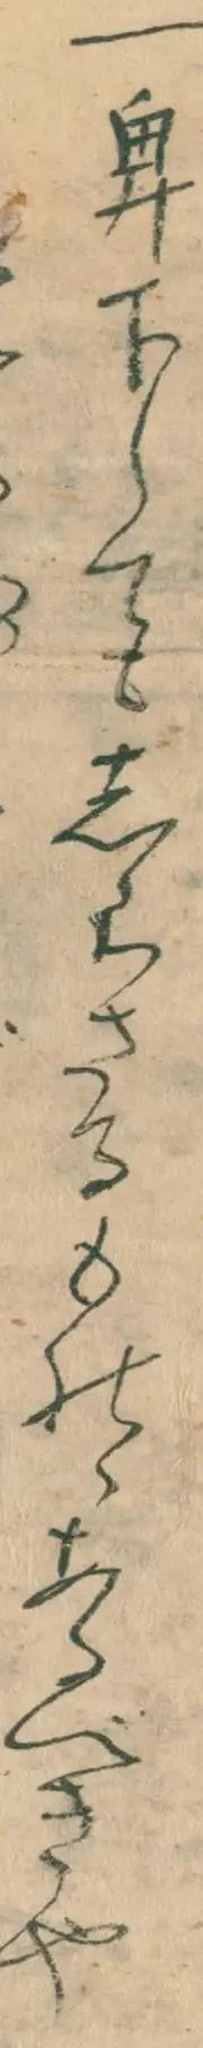〽卑下してもしらさるものゝあるべきや
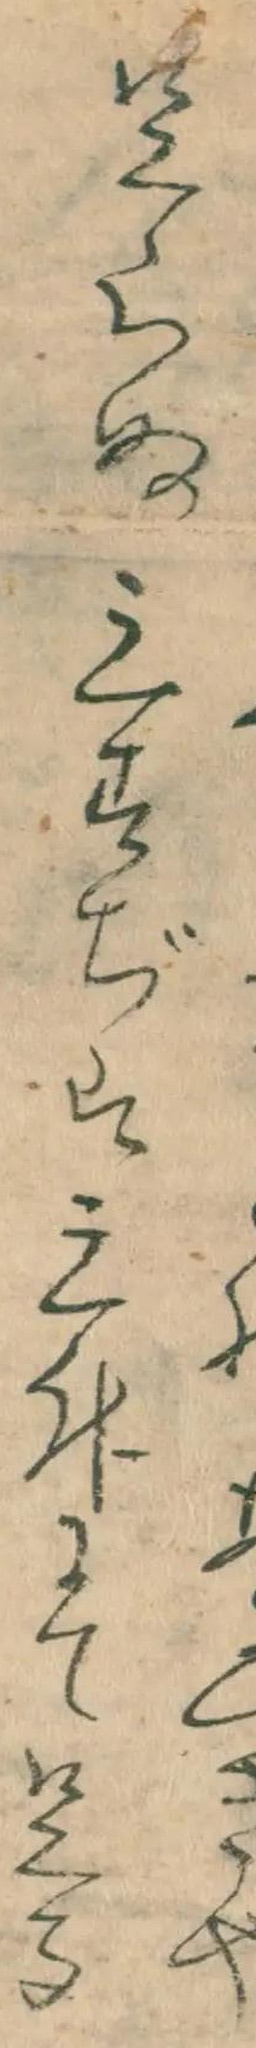足らぬ三すぢは三升にて足る
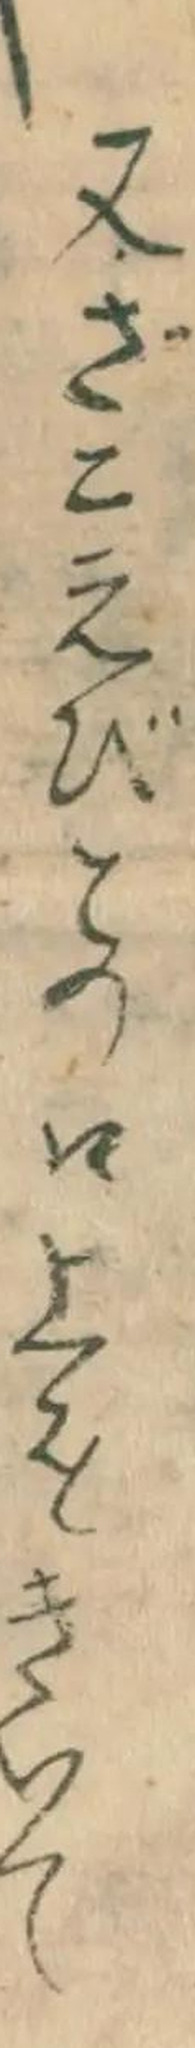又ざこえびとの口上をきいて
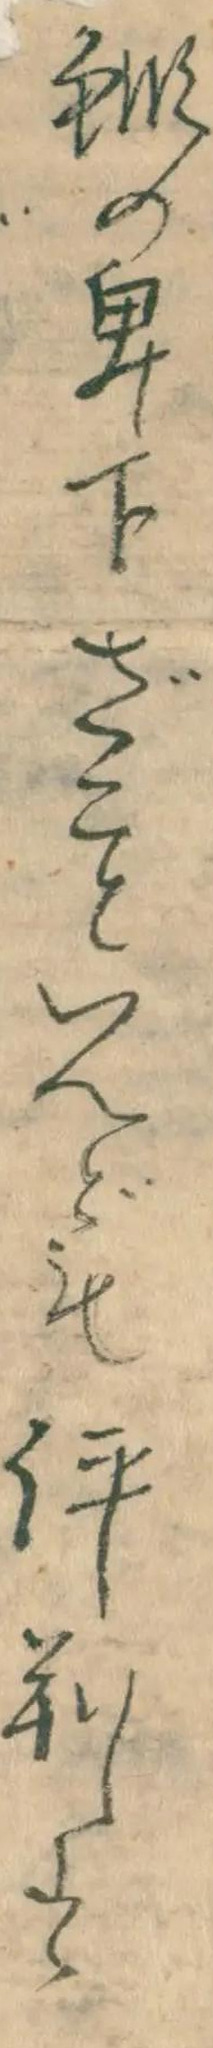〽鰕の卑下ざこと思ども評判は
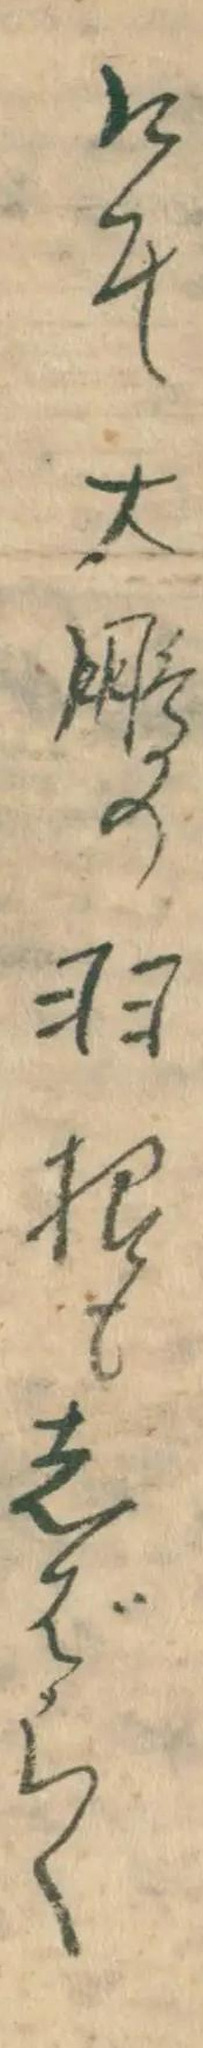げに大鵬の羽根もしばらく
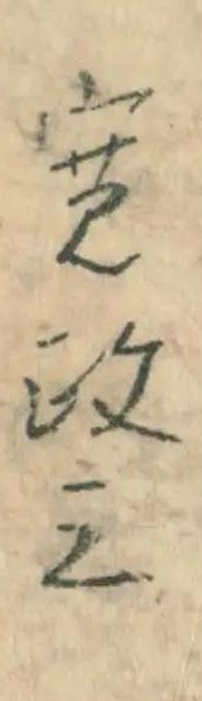寛政三
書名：江戸大芝居新役者附
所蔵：国立国会図書館 National Diet Library, JAPAN
